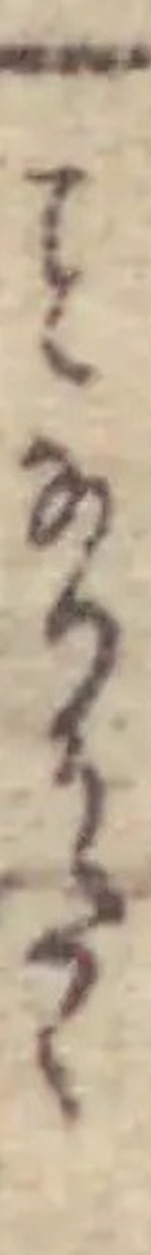ことなりかたく
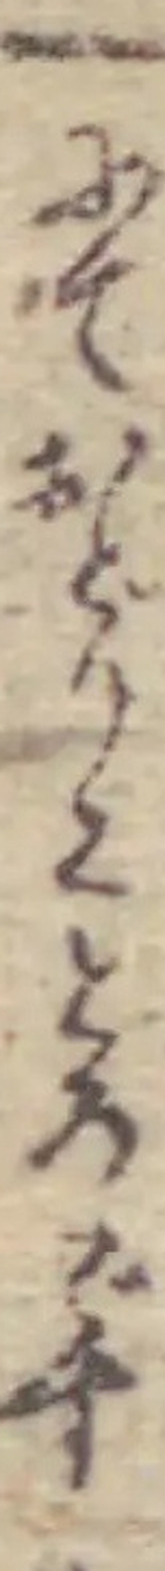にておどりこころばす
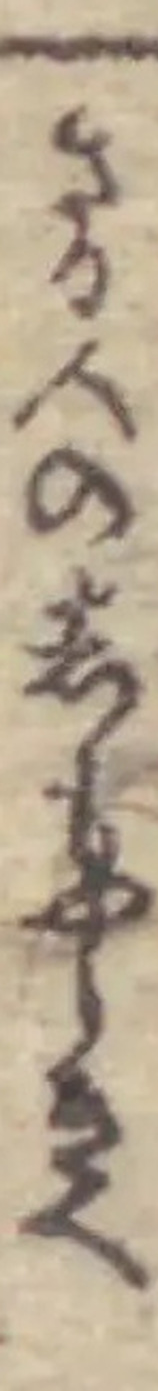さる人のしもやしきへ
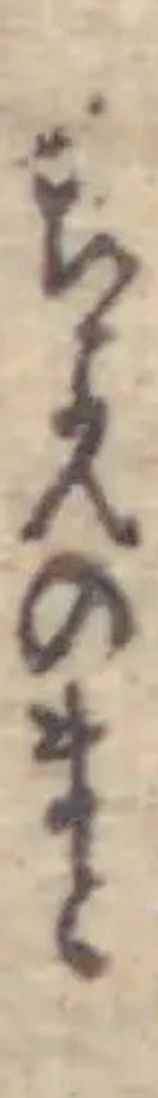ちよんのまと
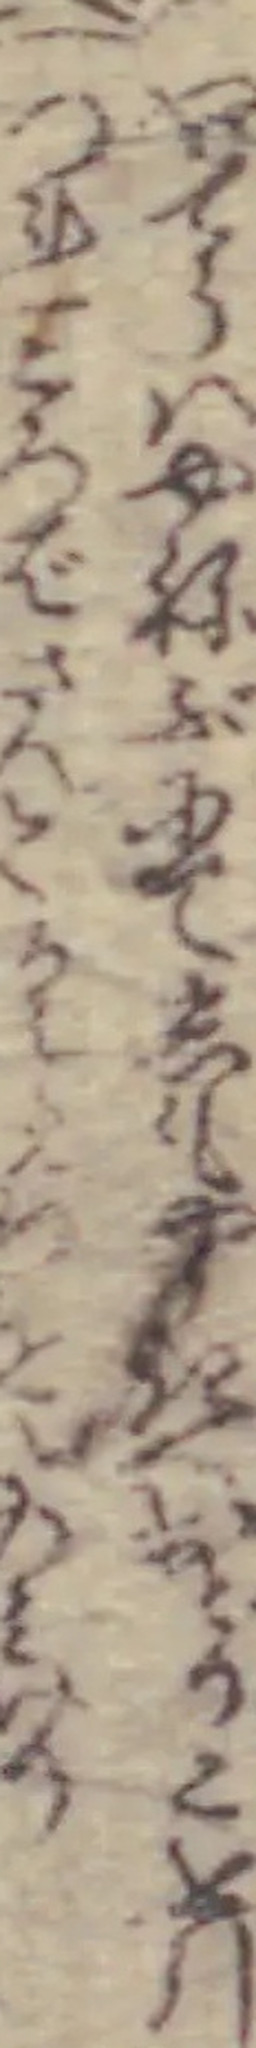つれころばさんとかみをたのみけり
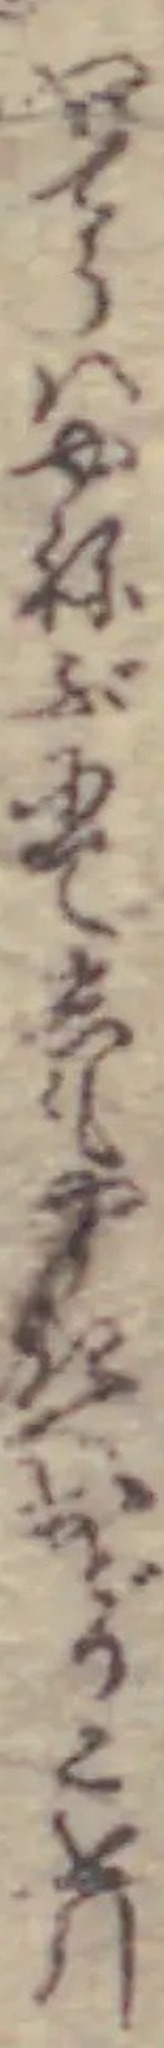やてうはやねぶにてしもやしきへおどりこを引
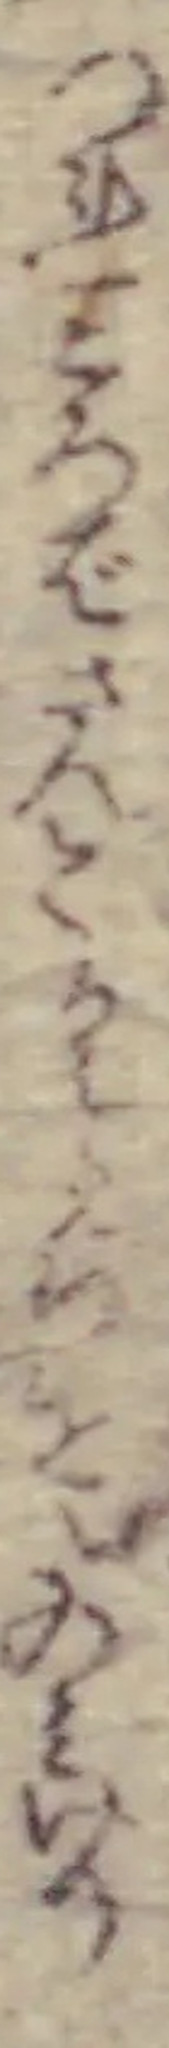つれころばさんとかみをたのみけり
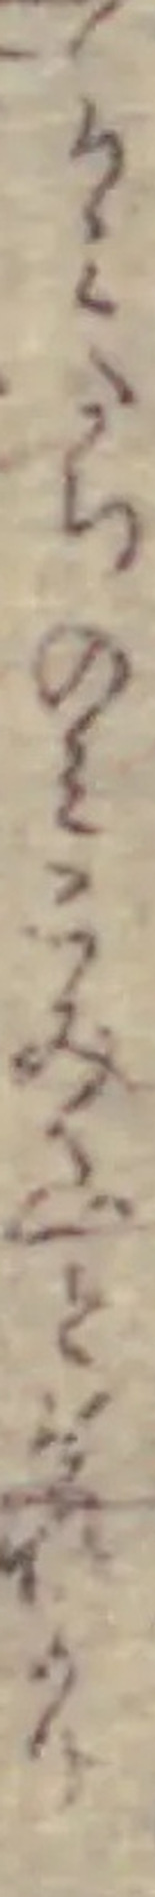かみたちのみこみ山とそれより
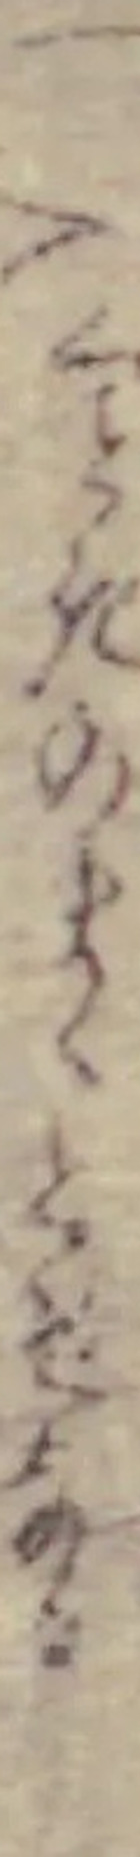くどきのまゝとぞなる
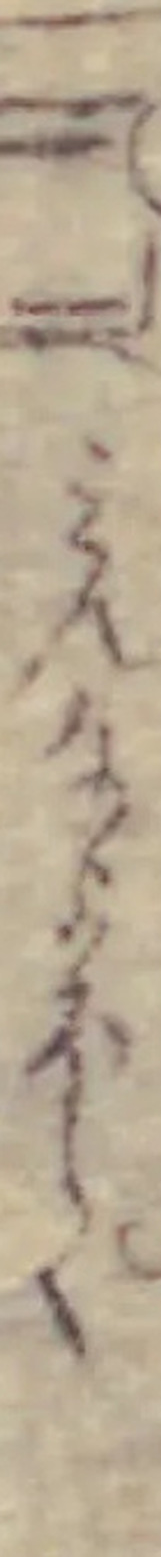みんなよろしく
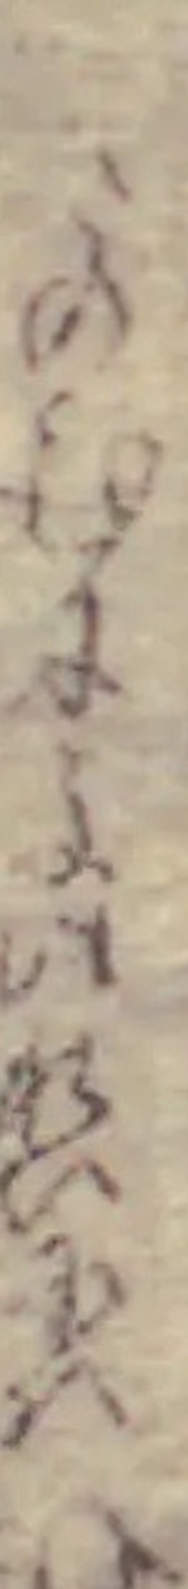たのむによ此れいには
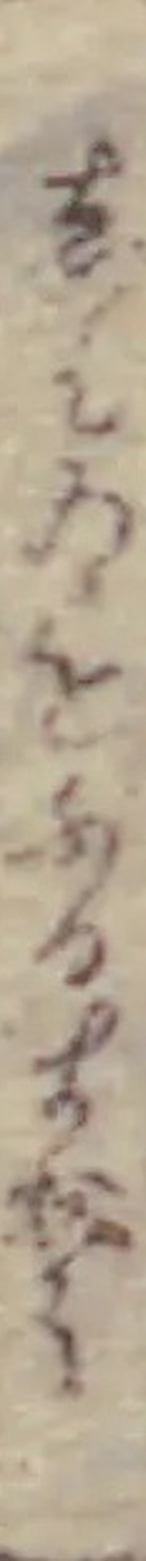しばゐをふるまおう
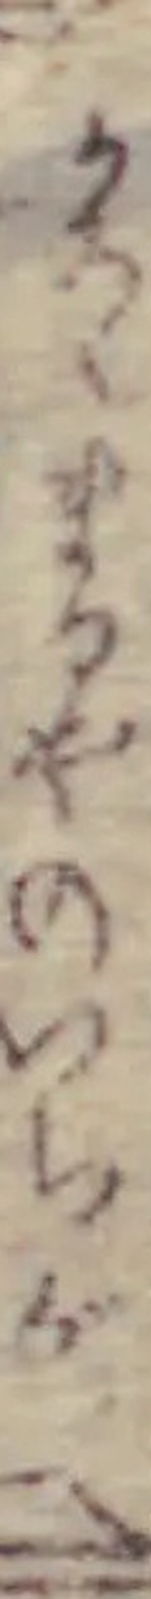かろくまるやのいちが
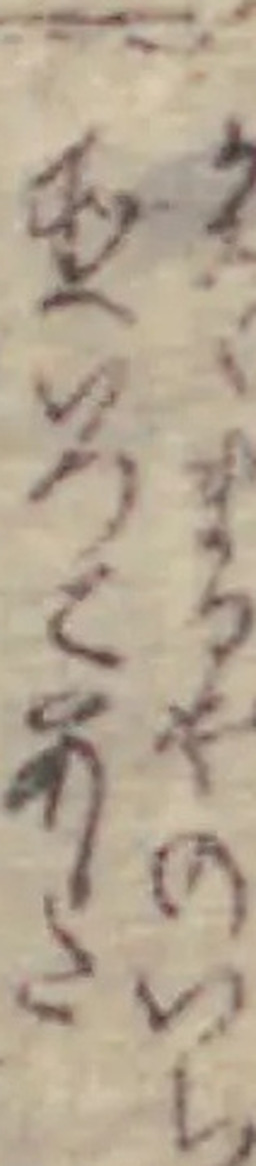所へいつてあした
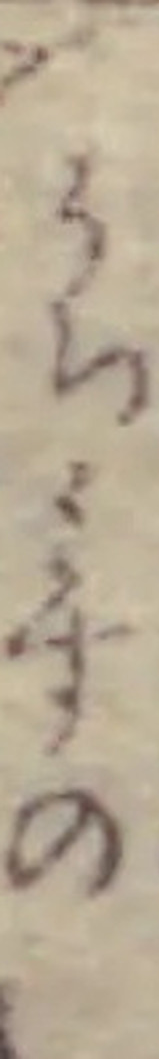うちみすの
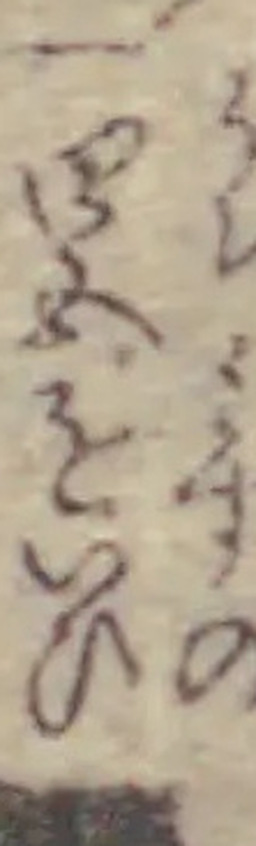四五もいひ
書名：夜野中狐物 2巻
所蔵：国立国会図書館 National Diet Library, JAPAN
